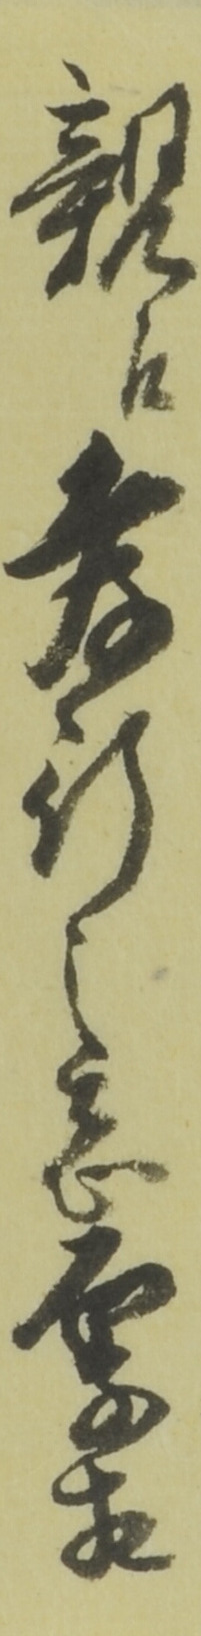親江孝行之志厚相
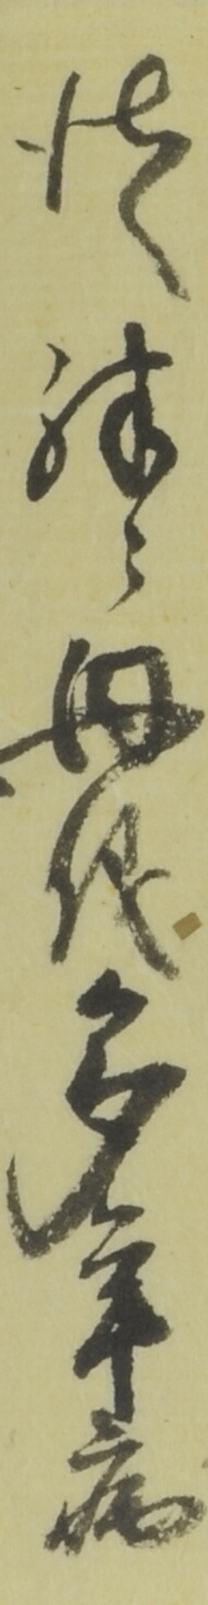仕候殊ニ母儀多年病
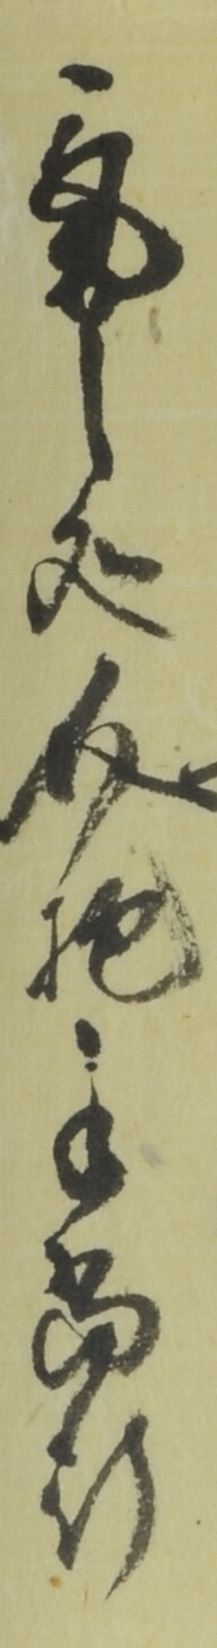気之処介抱手当行
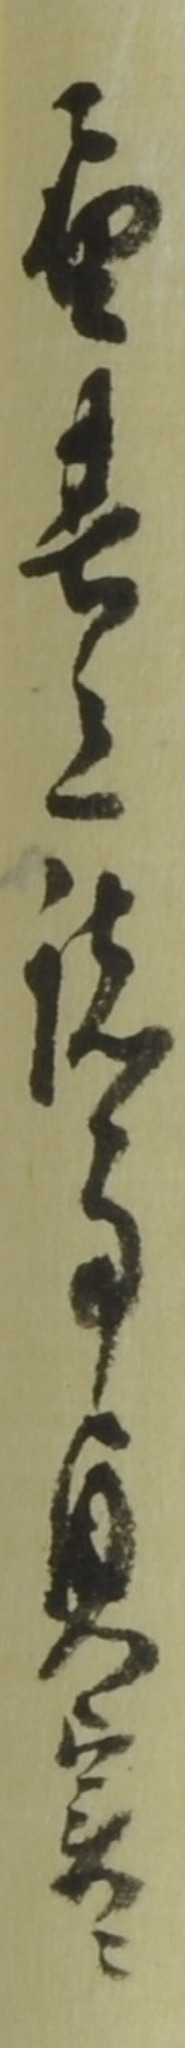届其上諸事貞実ニ
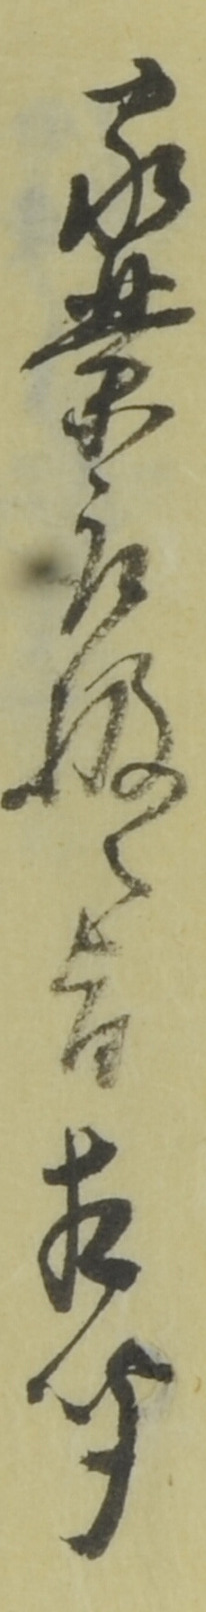家業取扱候旨相聞
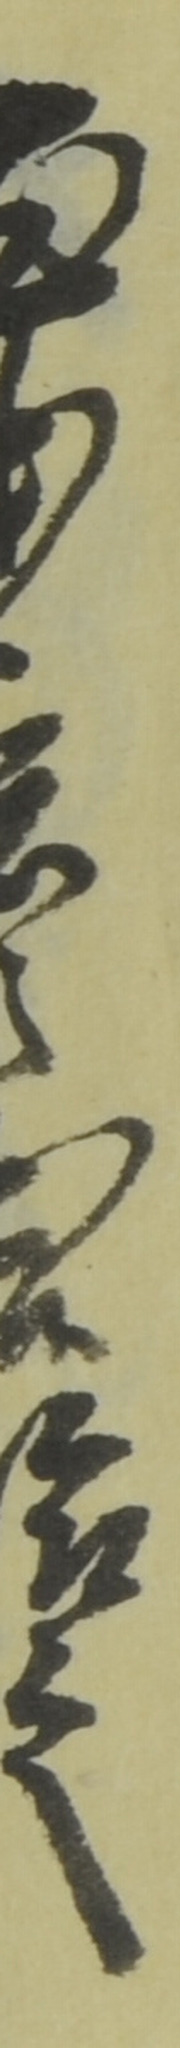尤本意之至候依之

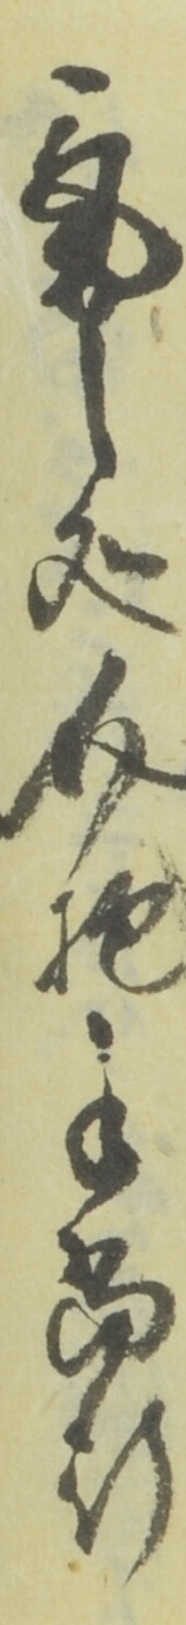気之処介抱手当行
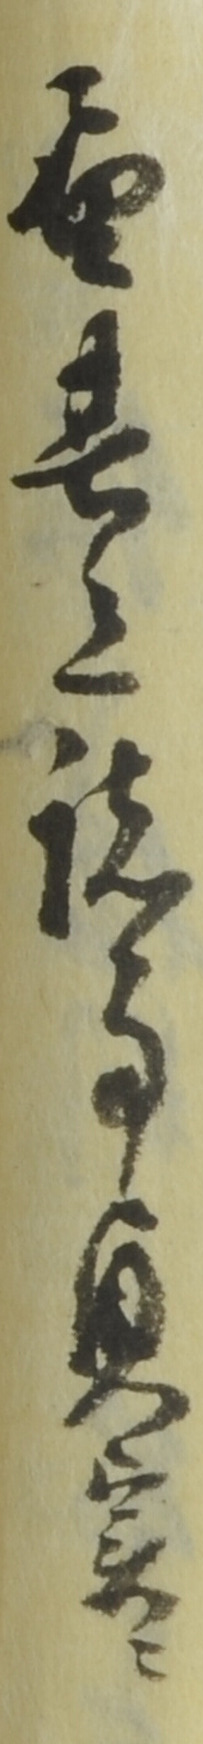届其上諸事貞実ニ
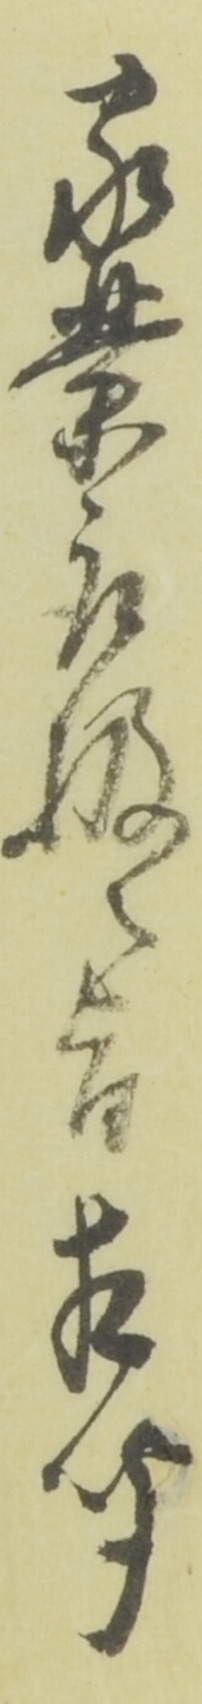家業取扱候旨相聞
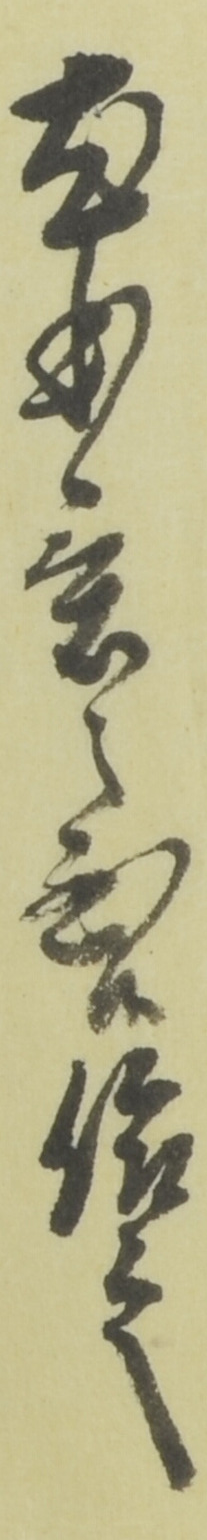尤本意之至候依之
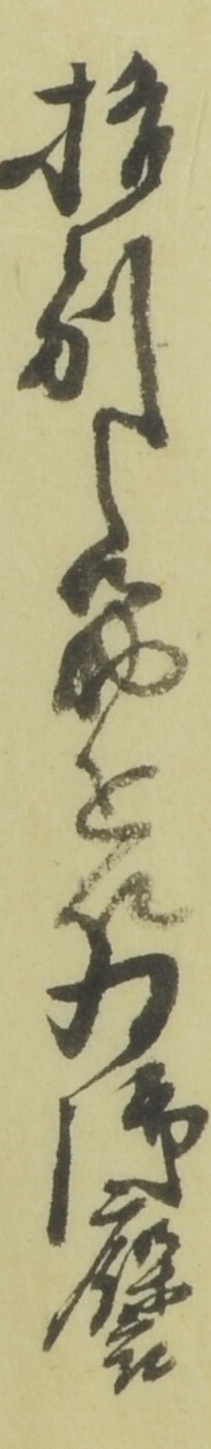格別之筋を以為御褒
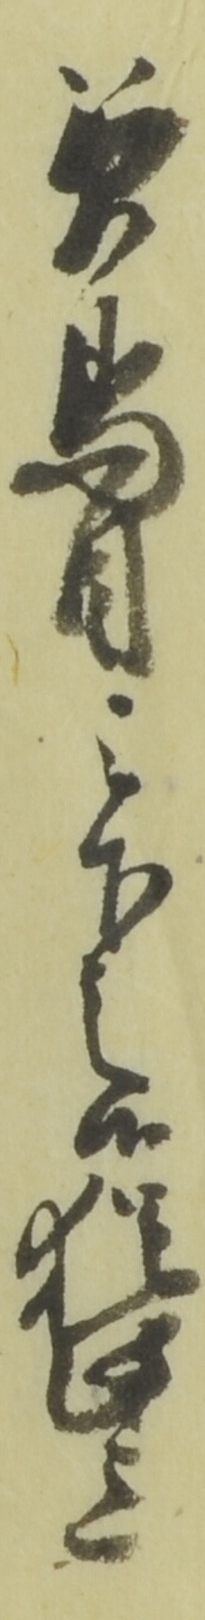美鳥目被下之候猶此上
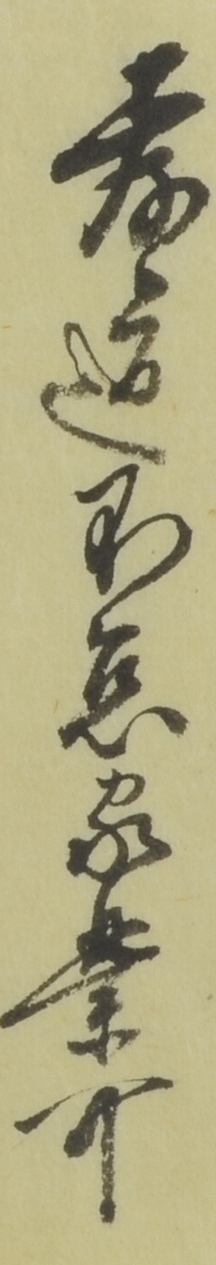孝道不怠家業可
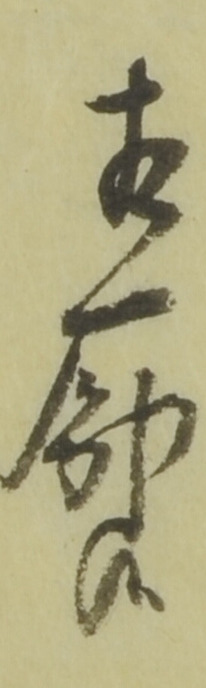相励候
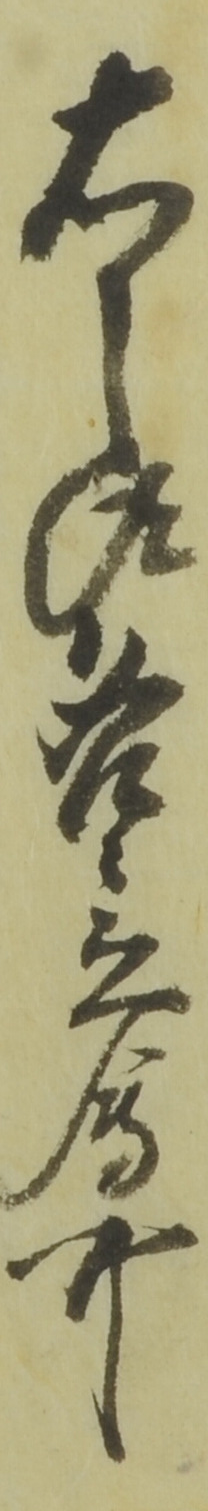右之趣各立会可
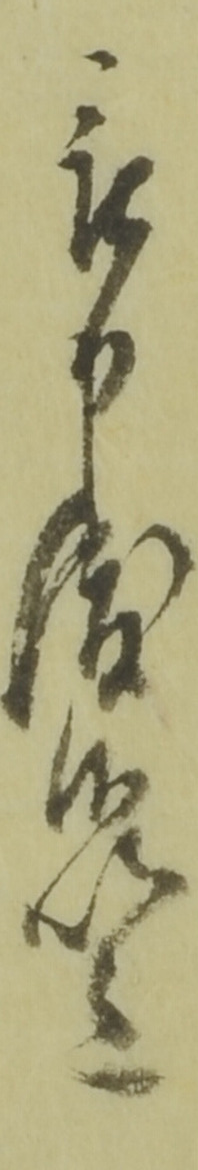被申渡候以上
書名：御触書御書附控
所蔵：伊那市立高遠町図書館・合同会社AMANE
